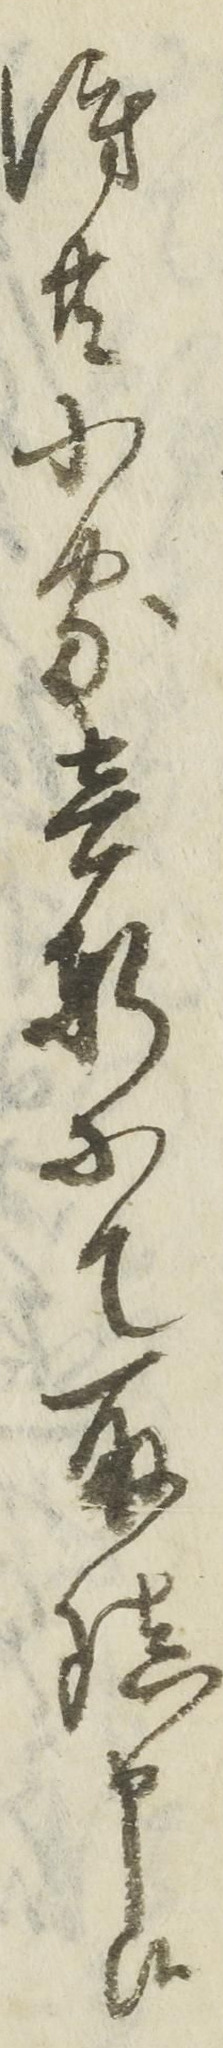得共小家壱軒にて取鎮申候
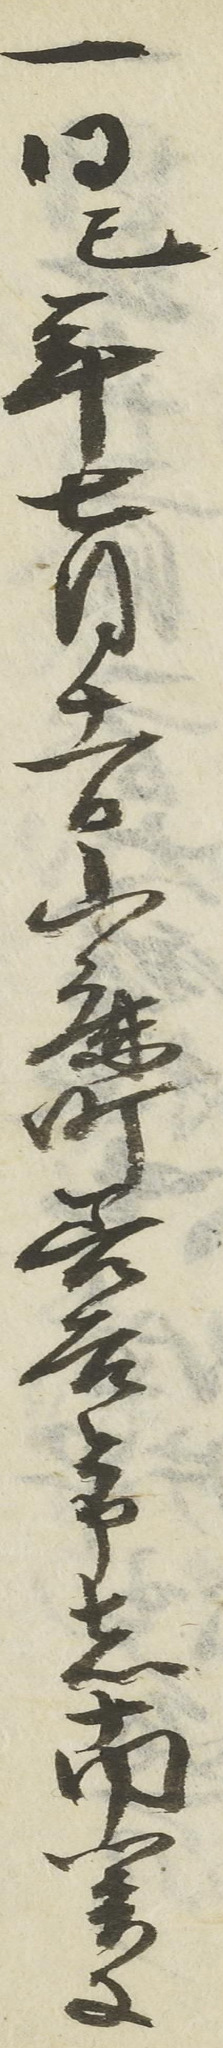一同巳年七月十一日山鹿町善吉と申者南関に
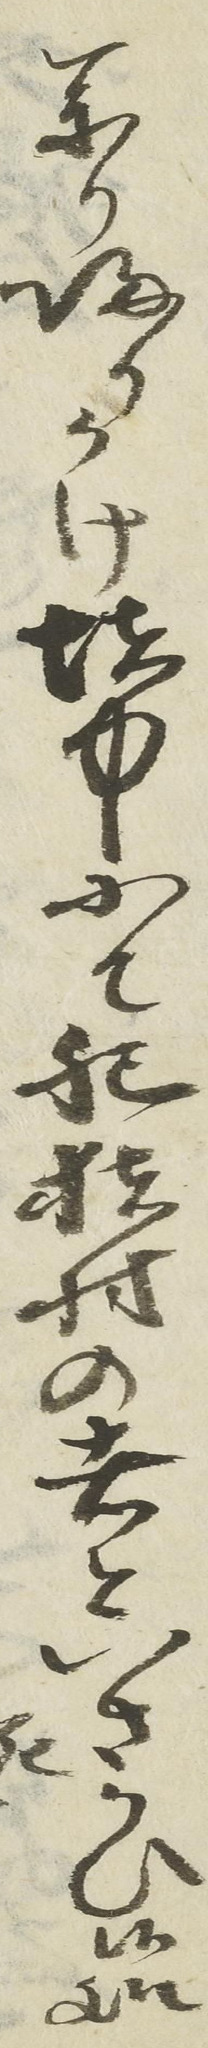参り帰りかけ諸中にて肥猪村の者といさかひ候処
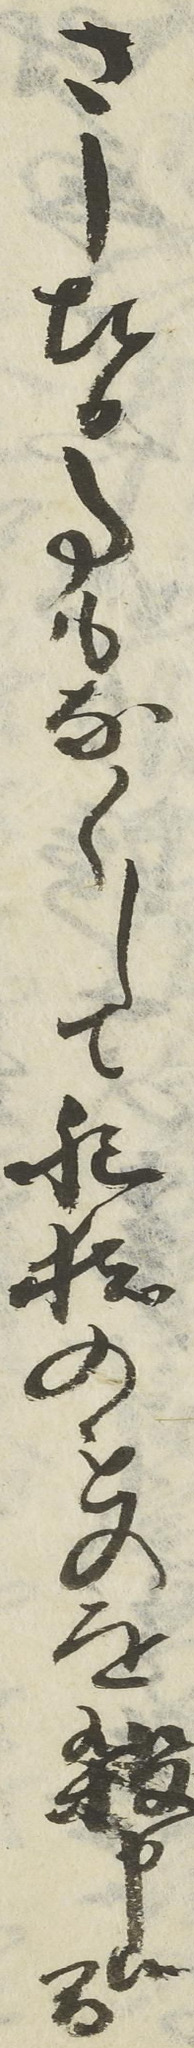さしたる亊もなくして肥猪のものを殺申候間
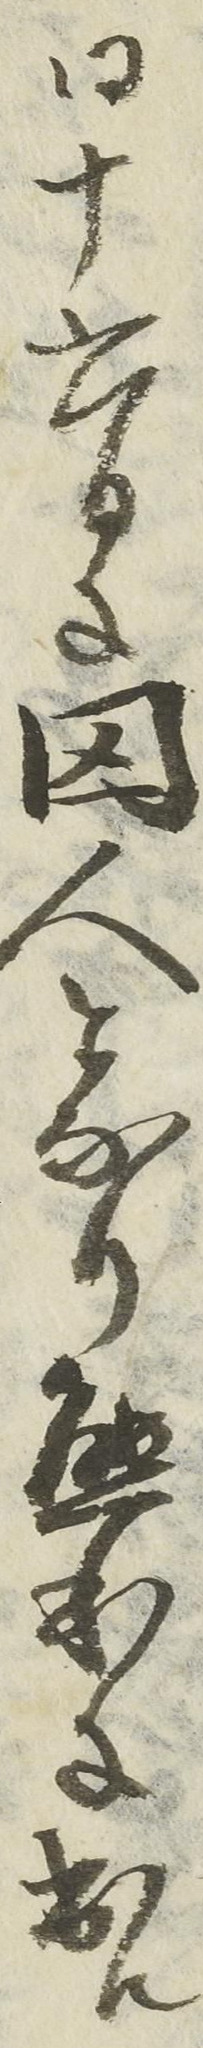同十六日に囚人となり熊本に出ル
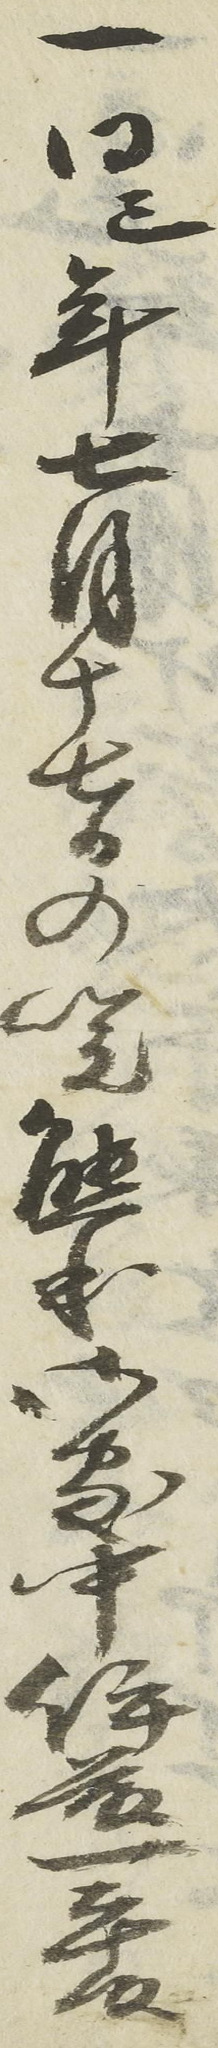一同巳年七月十七日の暁熊本御家中伊藤一平殿
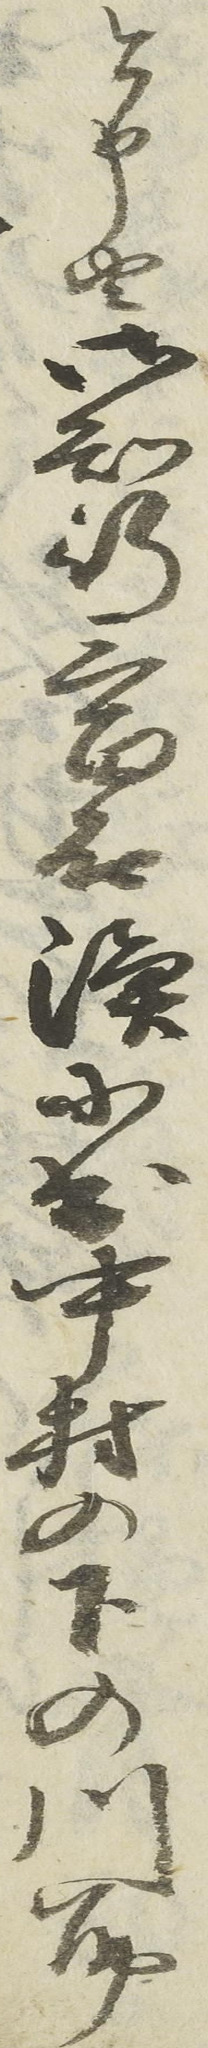と申由御知行三百石漁に出中村の下の川筋
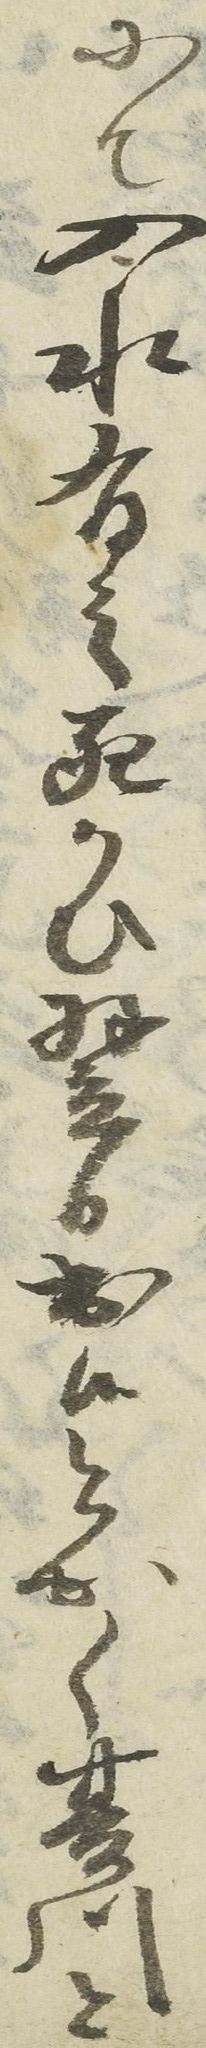にて入水有之死かい翌日出候とかく夏川と
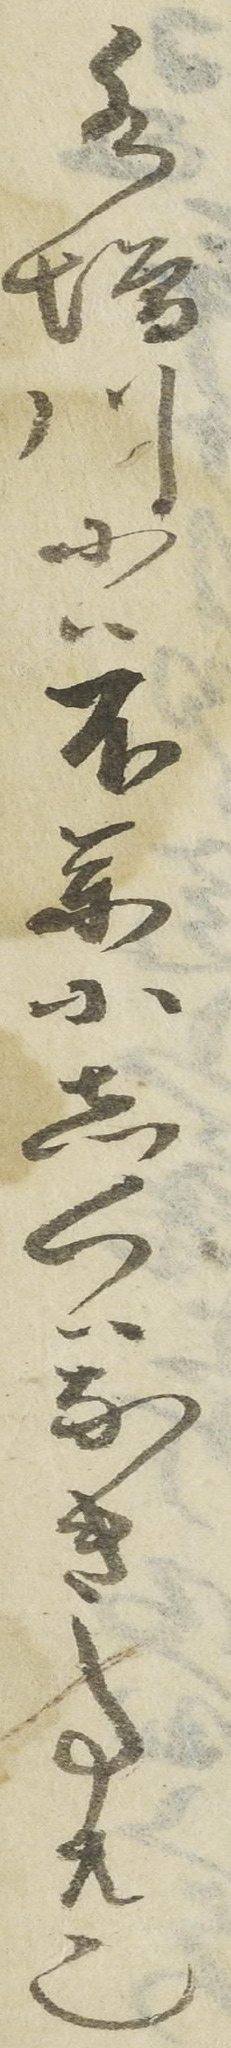水増川には不参にしくはなき事共也

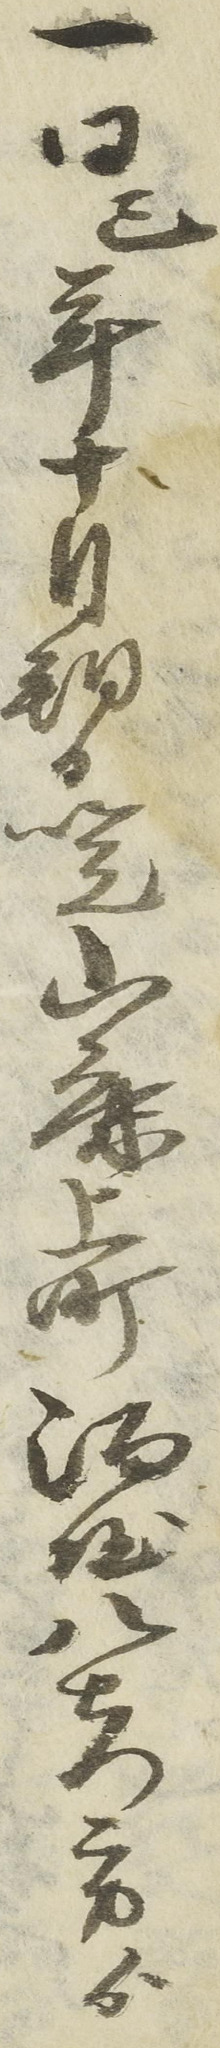一同己年十月朔日晩山鹿上町酒屋八右衛門方ゟ
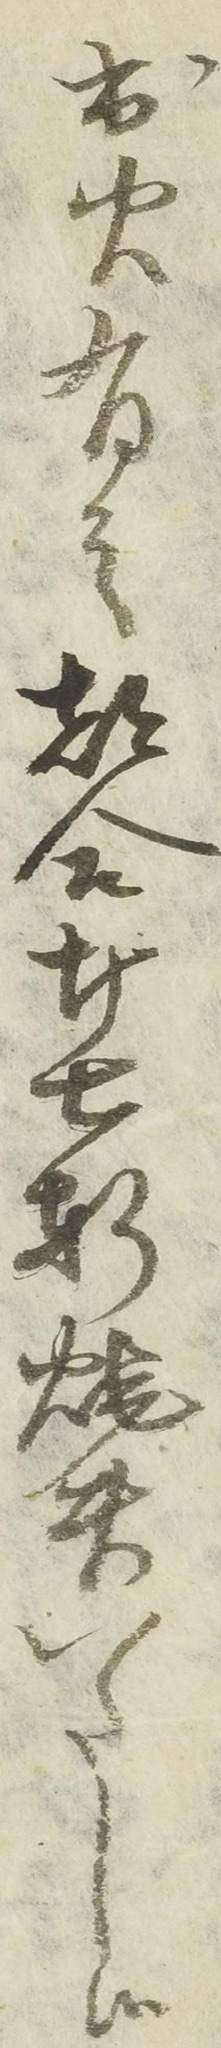出火有之都合二十七軒焼失いたし候
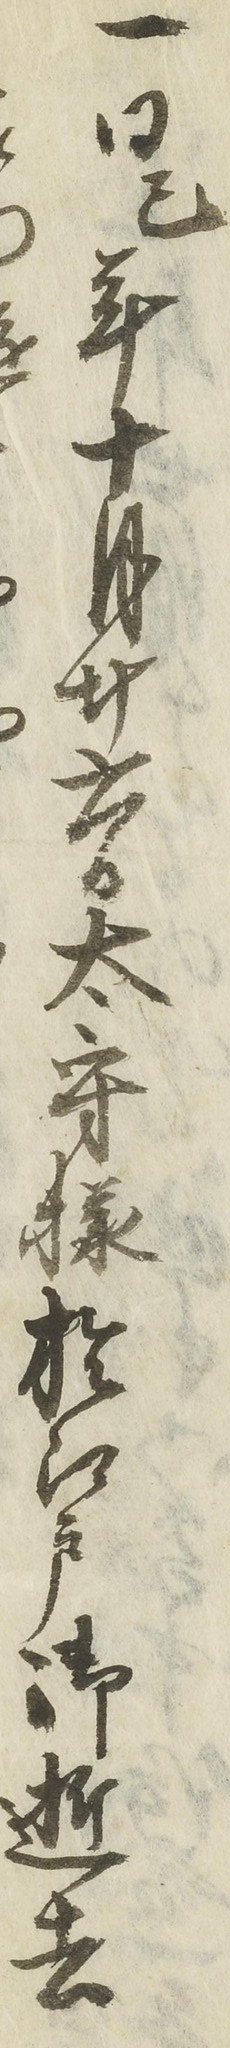一同己年十月廿六日太守様於江戸御逝去
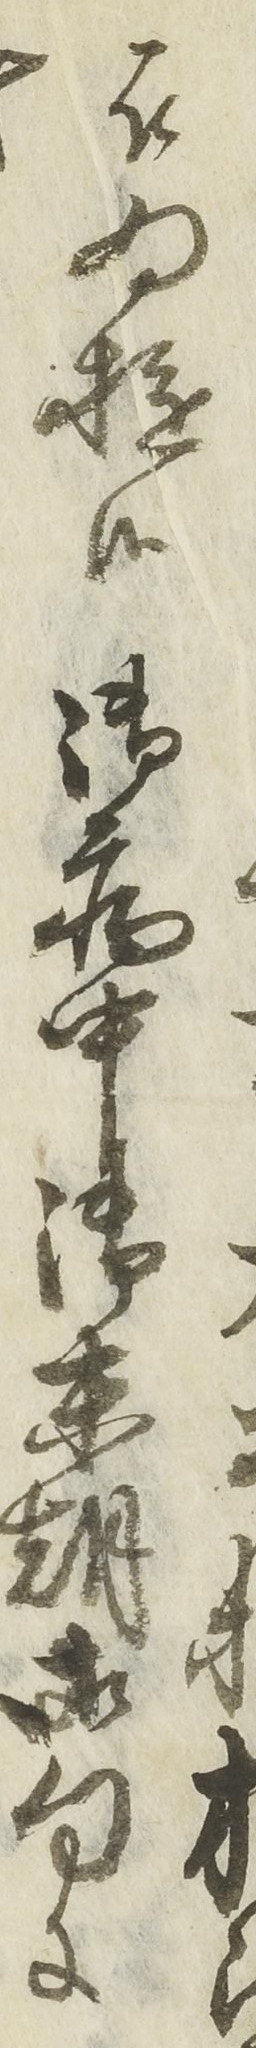被為遊候御病中御末期御句に
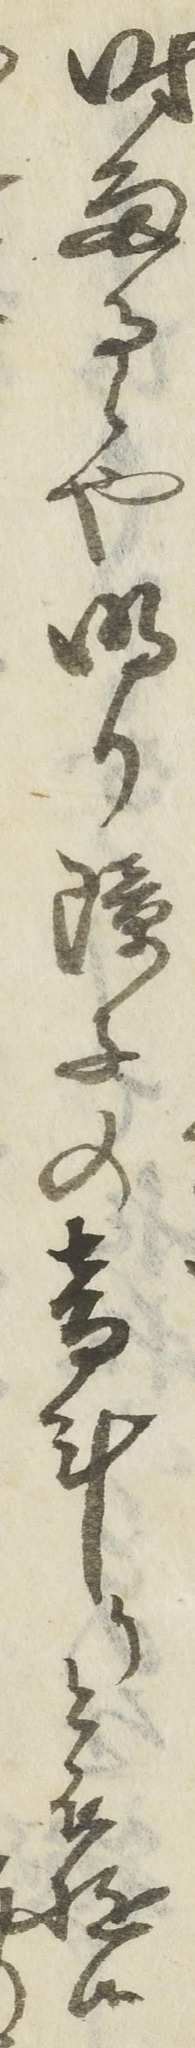時たるゝや明り障子の音計りと被遊候との噂
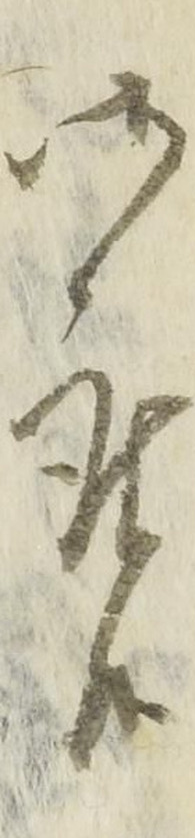御座候
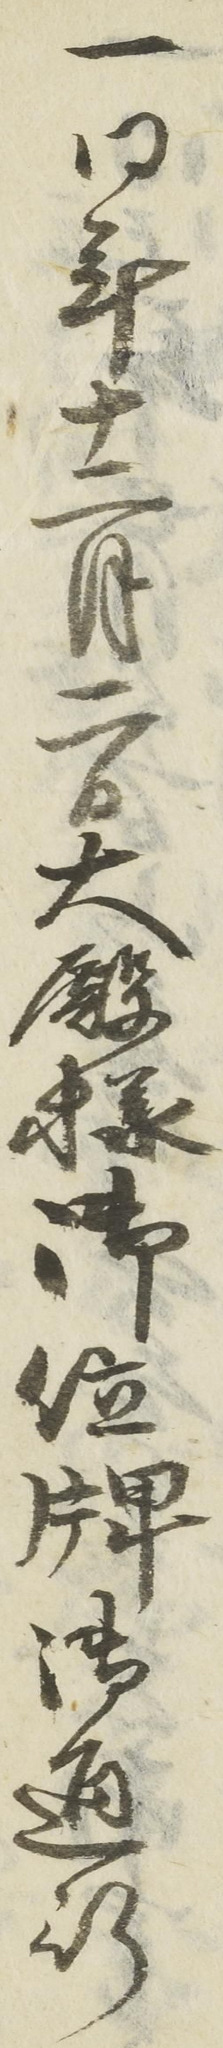一同年十二月二日大殿様御位牌御通行
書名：後見笑
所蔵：東京大学地震研究所図書室 Earthquake Research Institute Library, The University of Tokyo, JAPAN
